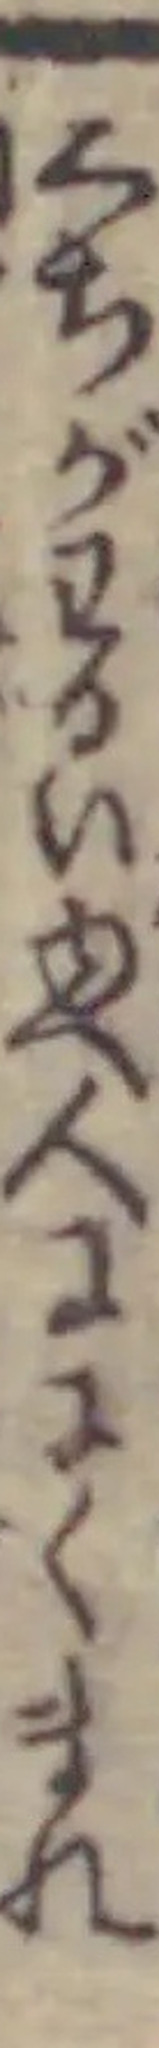くちがわるいゆへ人ににくまれ
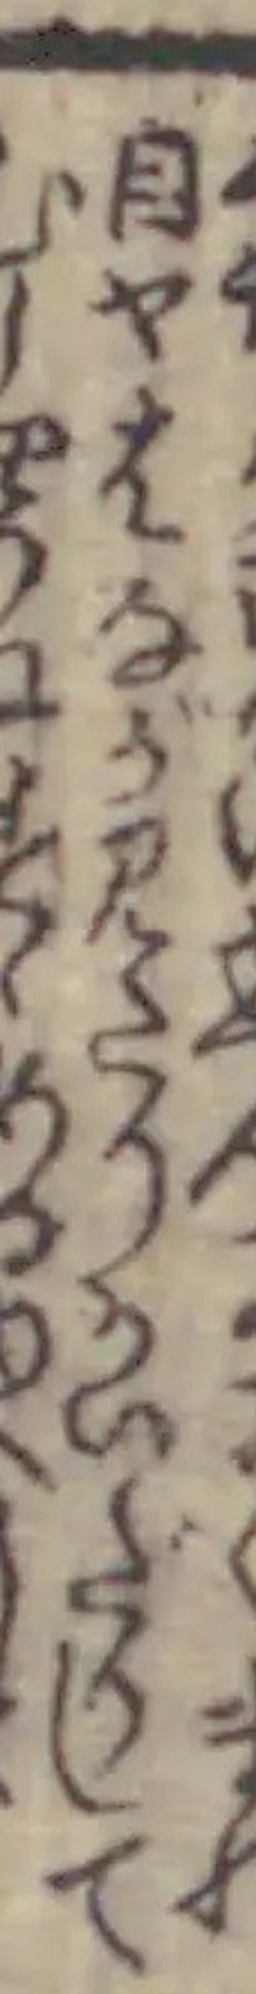むしやうにすゝめるゆへもと
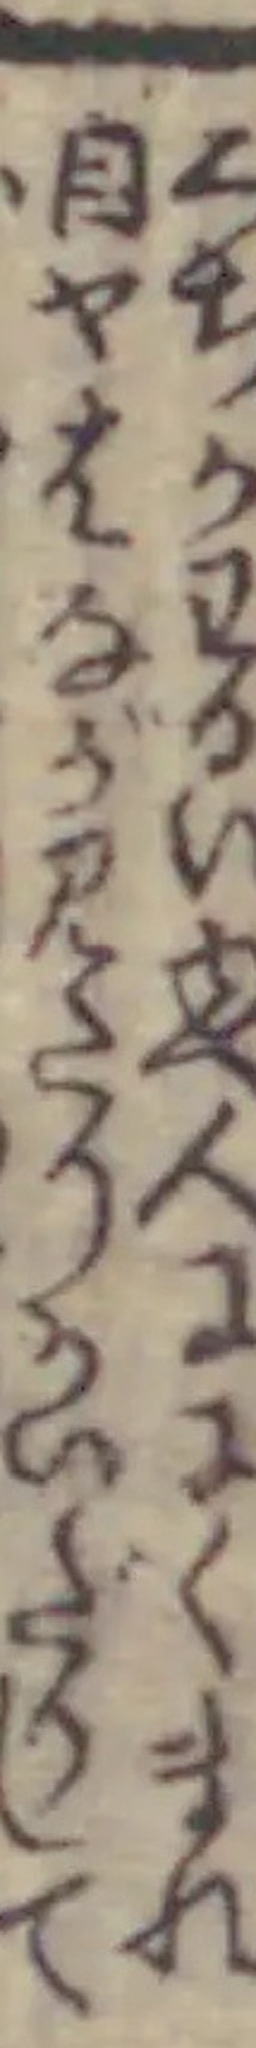目やはなが見たりかいだりして
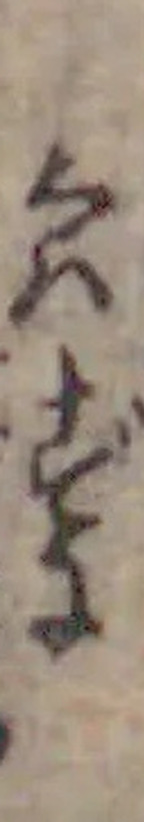くはずに
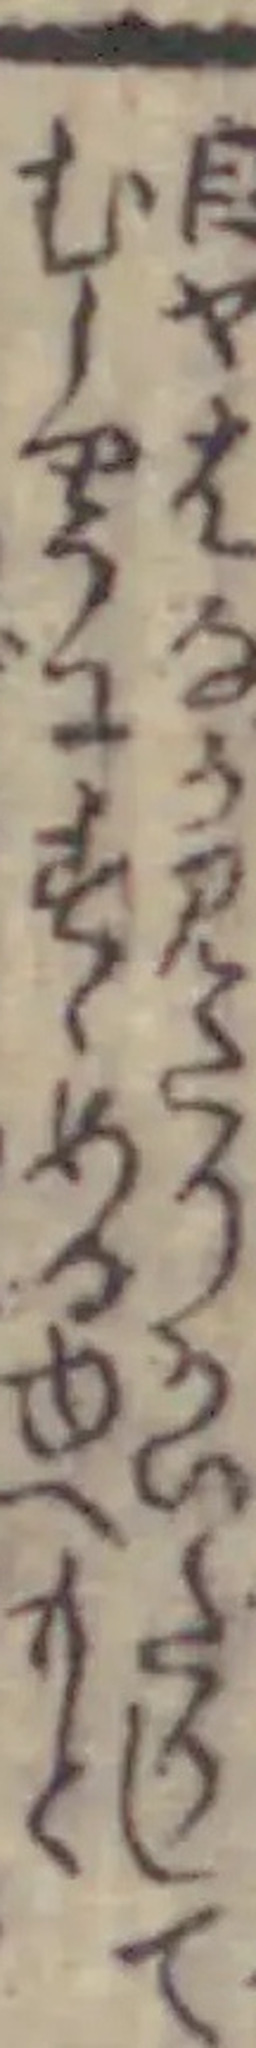むしやうにすゝめるゆへもと
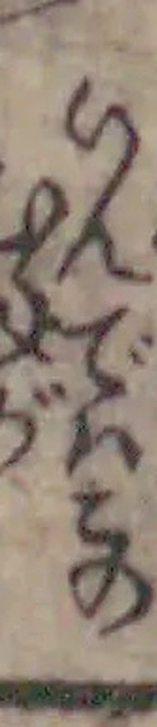いんではこの
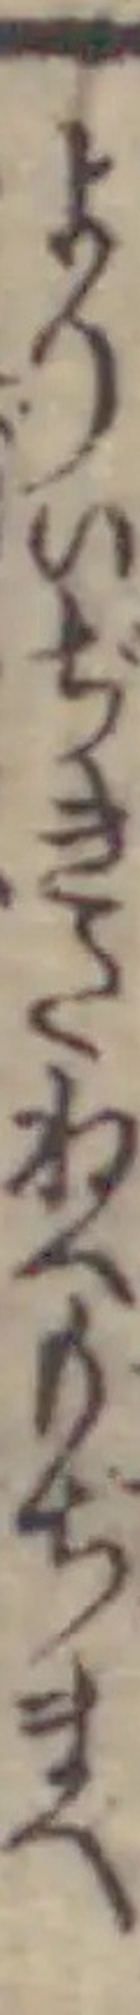よりいぢきたねへもちまへ
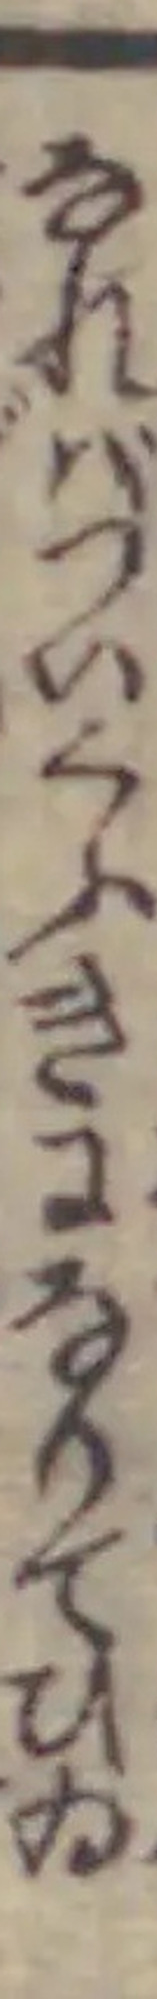なればついくふきになりてひゐ
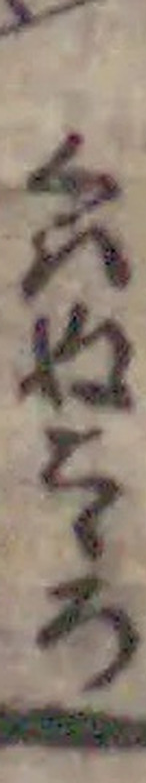くはぬこゝろ
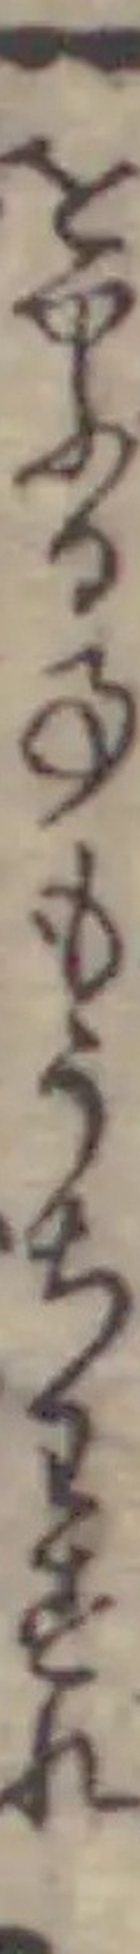をやぶる事もうちわすれ
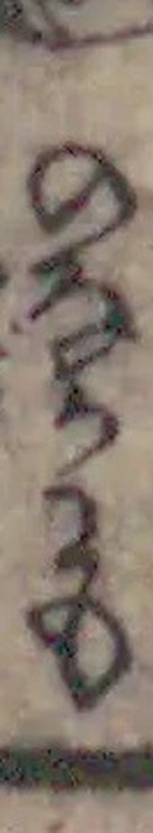のなかにも
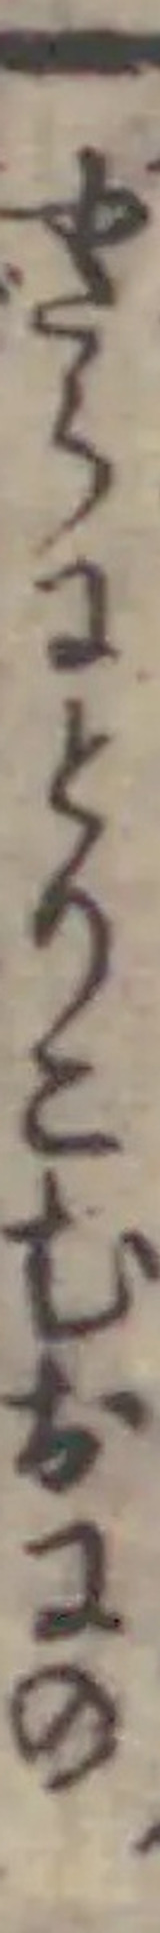やたらにとりこむおにの
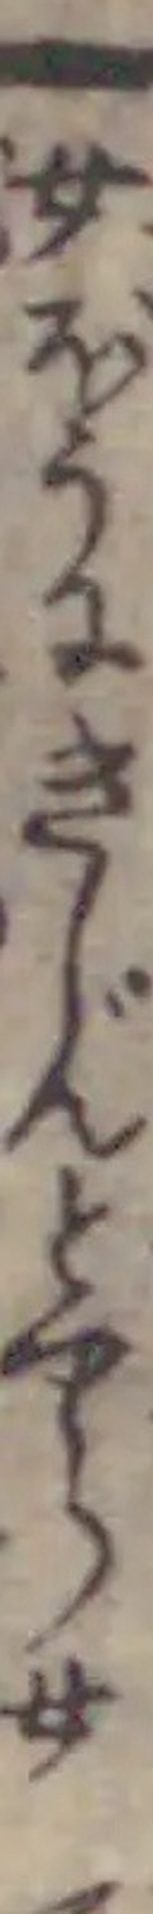女ぼうにきじんとやら女
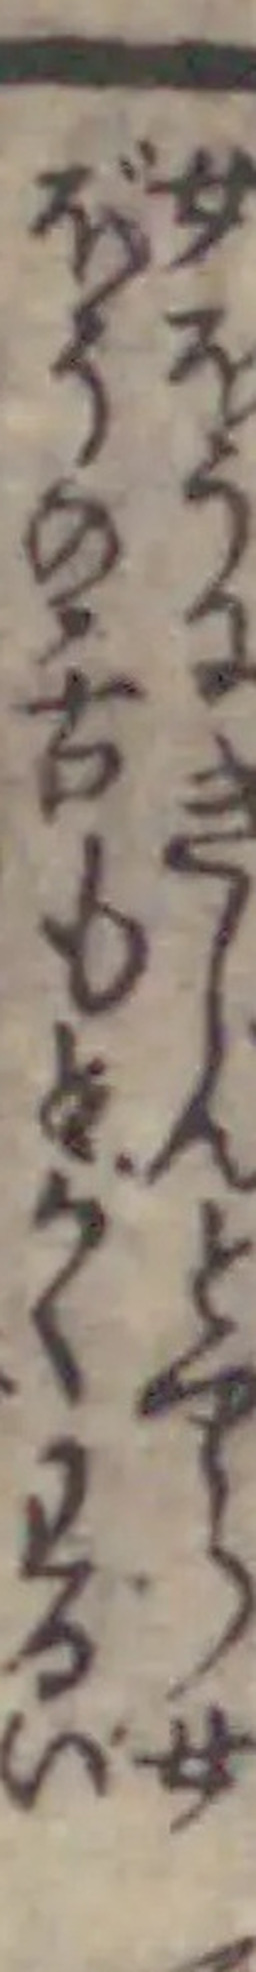ぼうの舌もとかくわるい
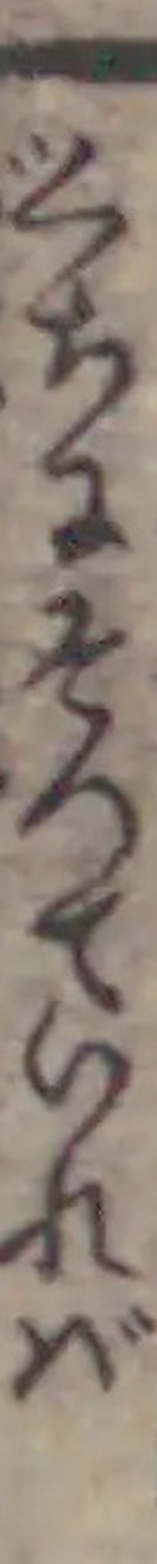くちにそつていれば
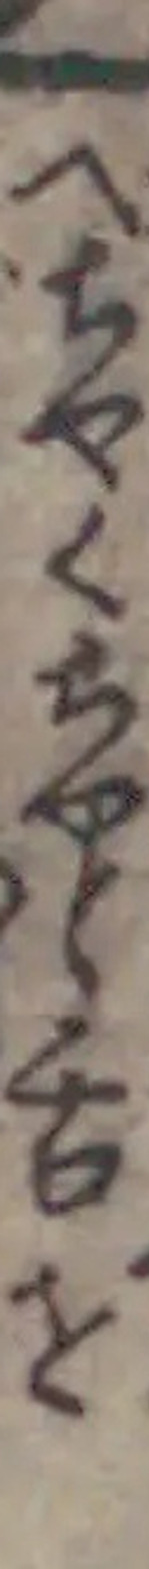べちやくちやと舌を
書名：腹内養生主論 3巻
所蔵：国立国会図書館 National Diet Library, JAPAN
